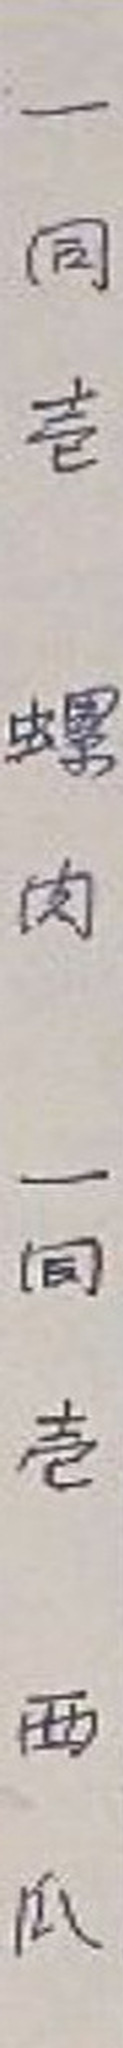一同壱螺肉一同壱西瓜
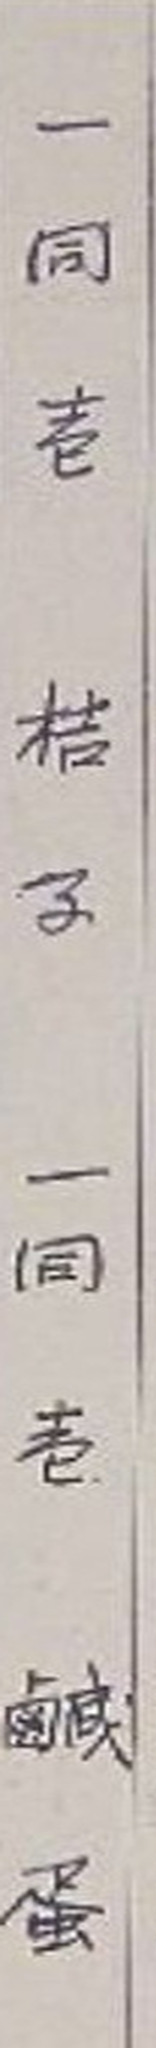一同壱桔子一同壱鹹蛋
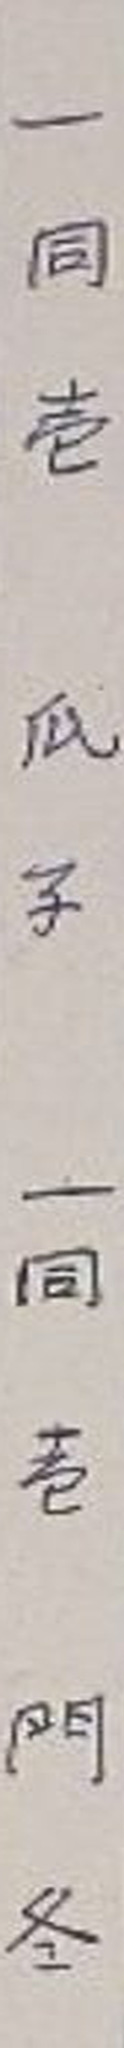一同壱瓜子一同壱門冬
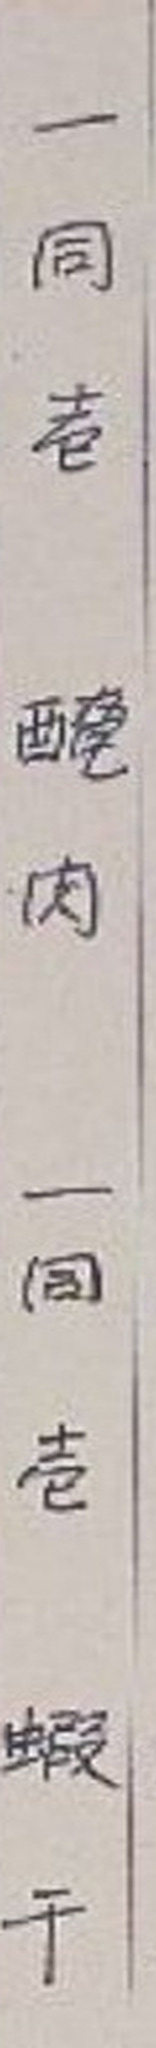一同壱醃肉一同壱鰕干
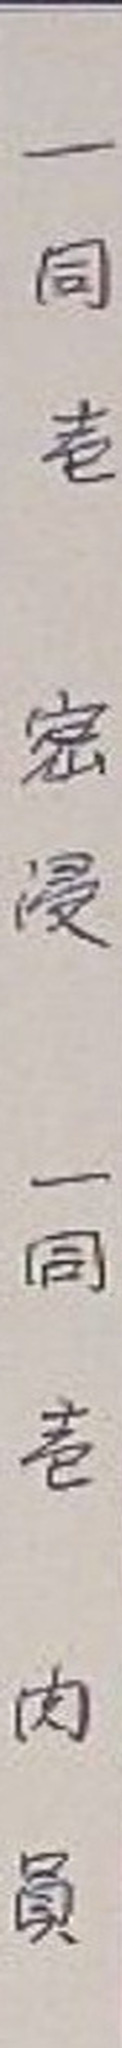一同壱密浸一同壱肉員
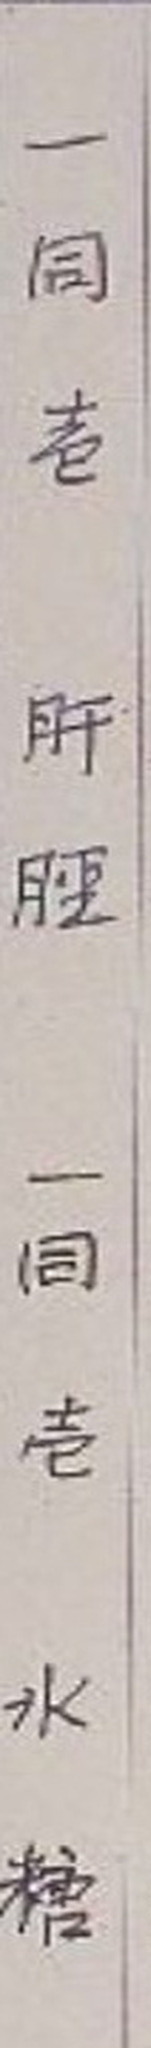一同壱肝脛一同壱氷糖
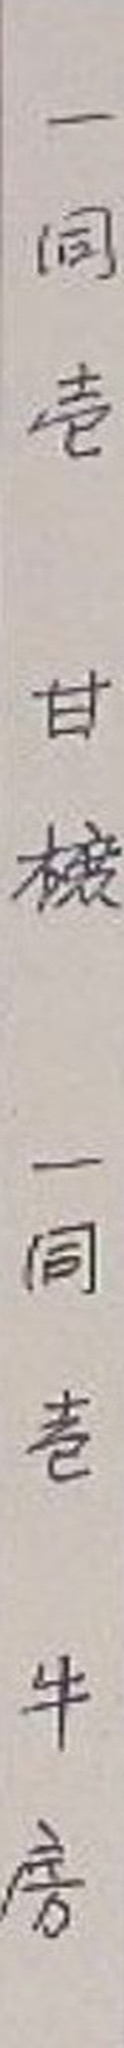一同壱甘樜一同壱午房

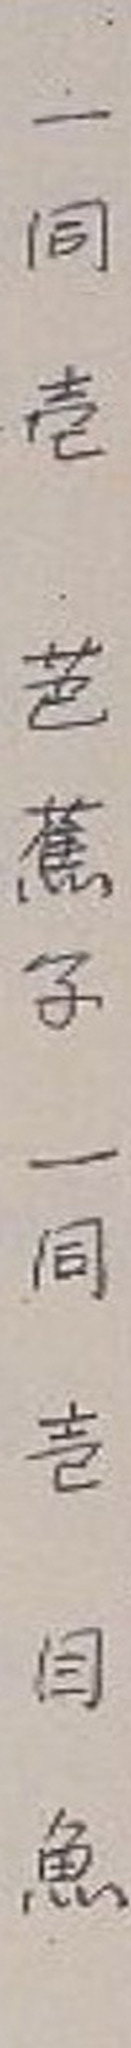一同壱芭蕉子一同壱目魚
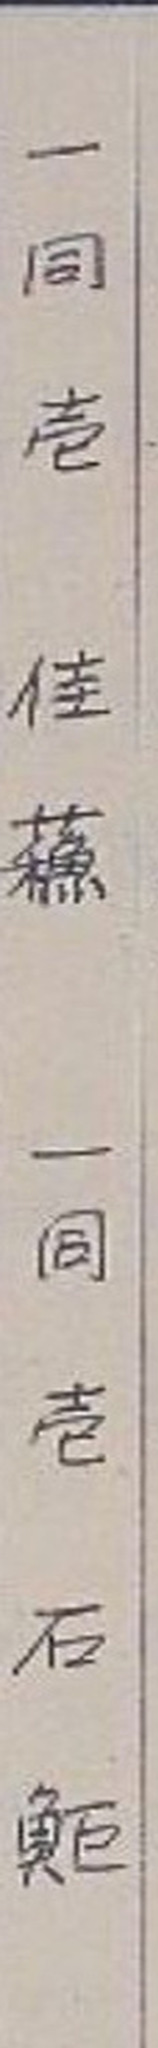一同壱佳蘇一同壱石鮔
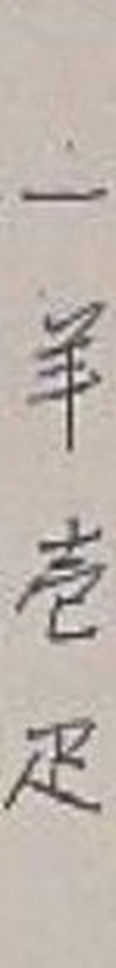一羊壱疋
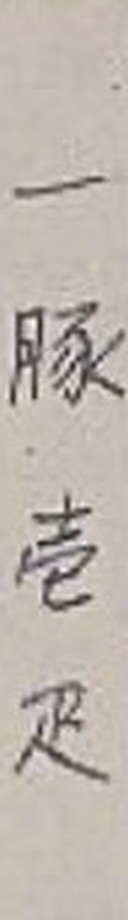一豚壱疋
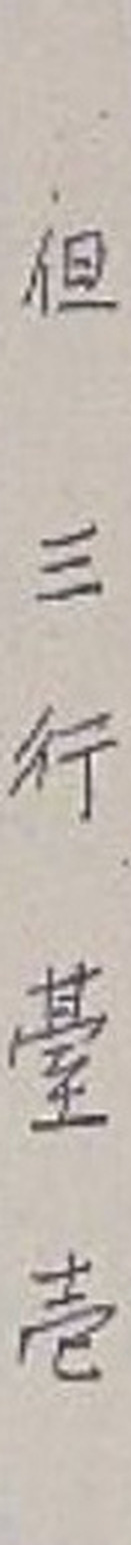但三行台壱
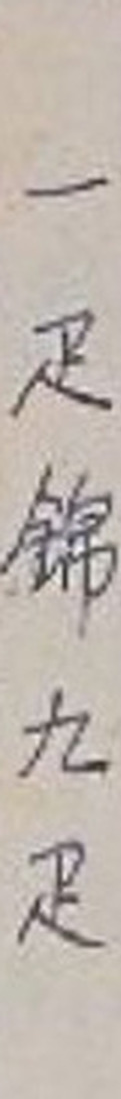一疋錦九疋
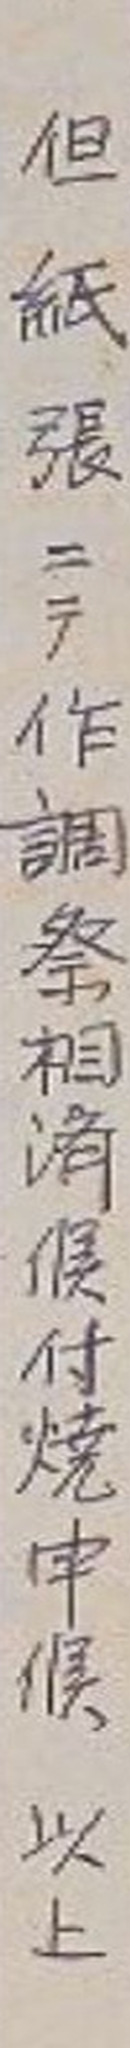但紙張にて作調祭相済候付焼申候以上
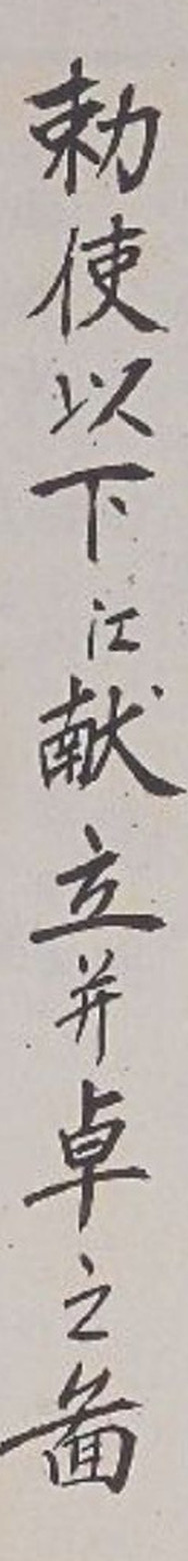勅使以下え献立并卓之図

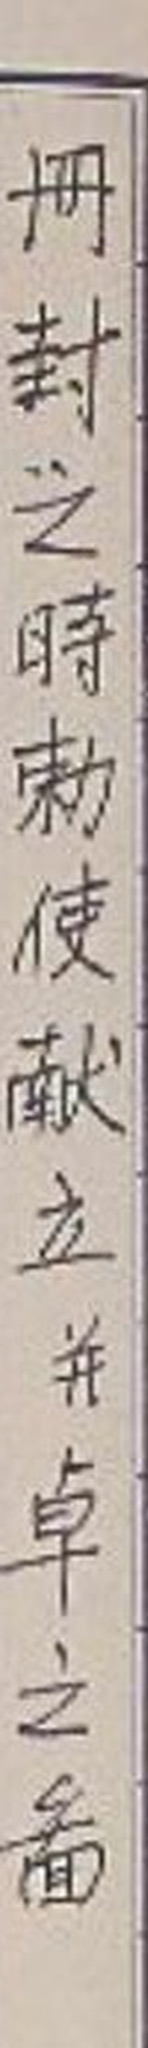冊封之時勅使献立并卓之図
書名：支那冊封使来琉諸記 下巻
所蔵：University of the Ryukyus Library
